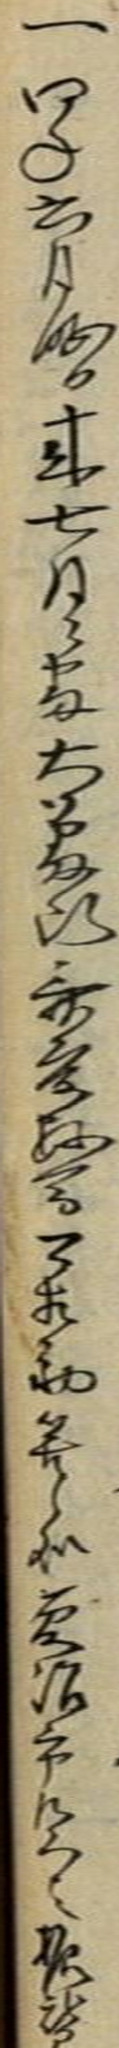一同年六月晦日来七月々番大御番頭斉藤数馬可相勤筈之処菅沼市左衛門へ振替り
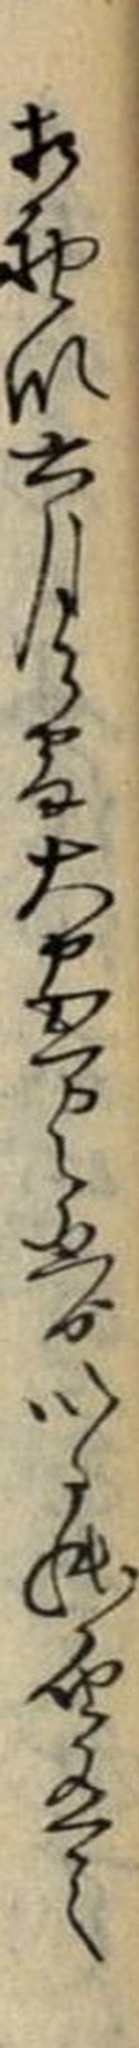相勤候段六月々番大宮万之丞ゟ以手紙届有之
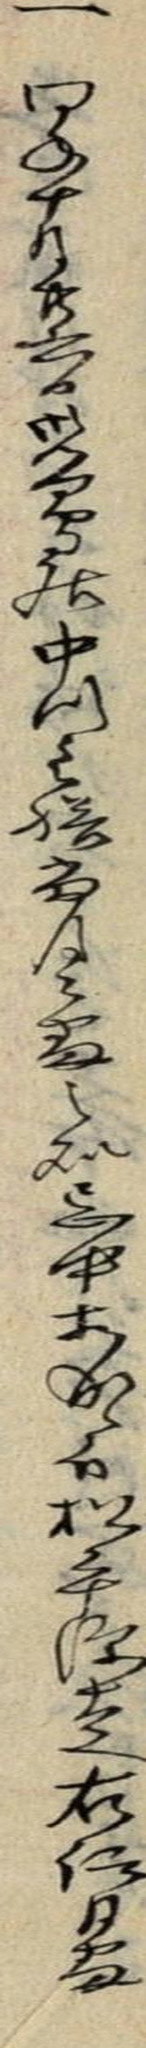一同年十月廿六日御留守居中川主膳当月々番之処忌中相成候に付松平源太夫右跡月番
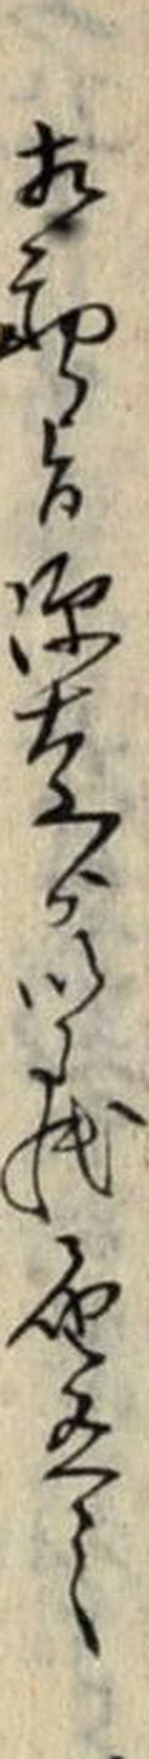相勤候旨沖之助ゟ以手紙届有之
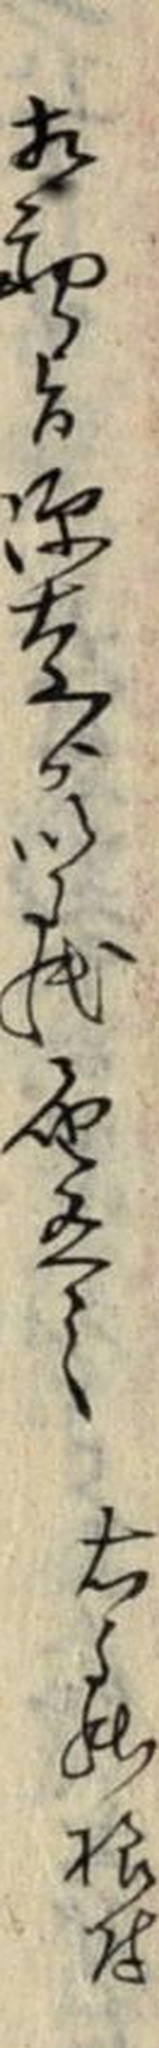相勤候旨源太夫ゟ以手紙届出有之右手紙様付
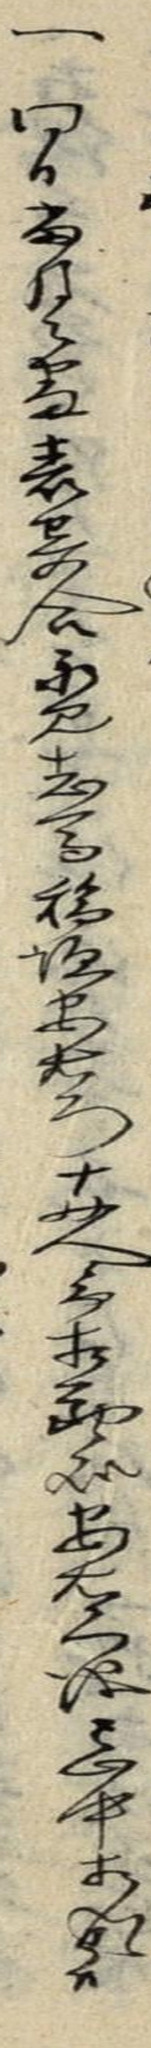一同日当月々番表寄合永見志馬稲垣安右衛門両人に而相勤候処安右衛門儀忌中に相成候に付
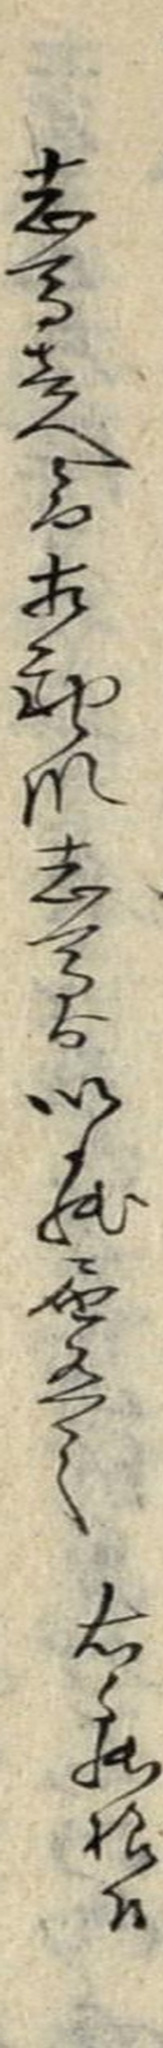志馬壱人に而相勤候段志馬ゟ以手紙届有之右手紙様付
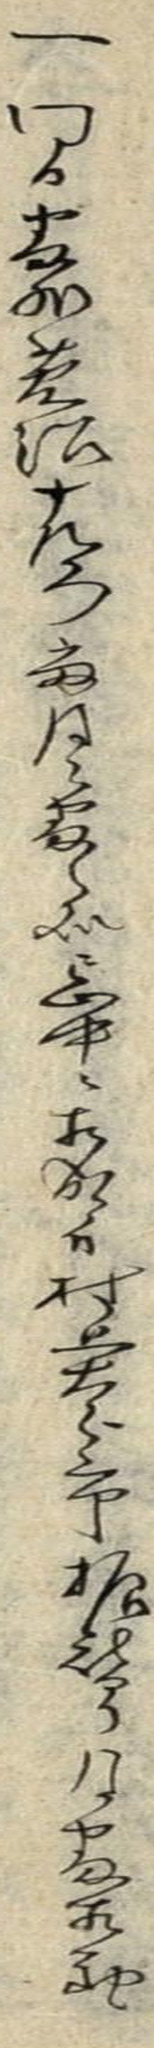一同日番外菅沼十左衛門当月々番之処忌中に相成候に付村上太郎市振替り月番相勤候
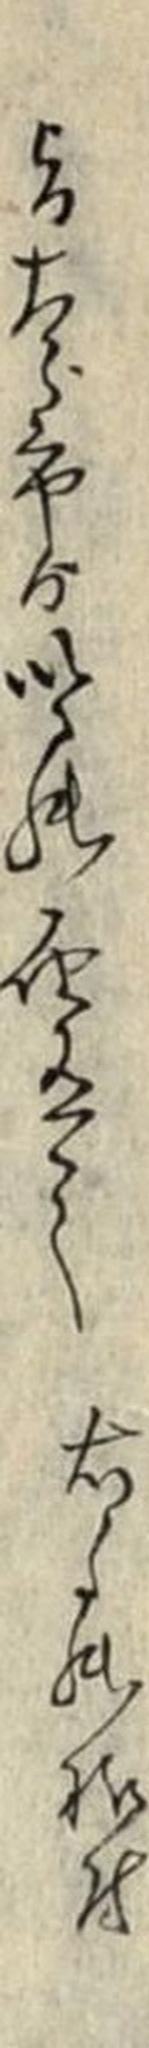旨太郎市ゟ以手紙届出有之右手紙様付
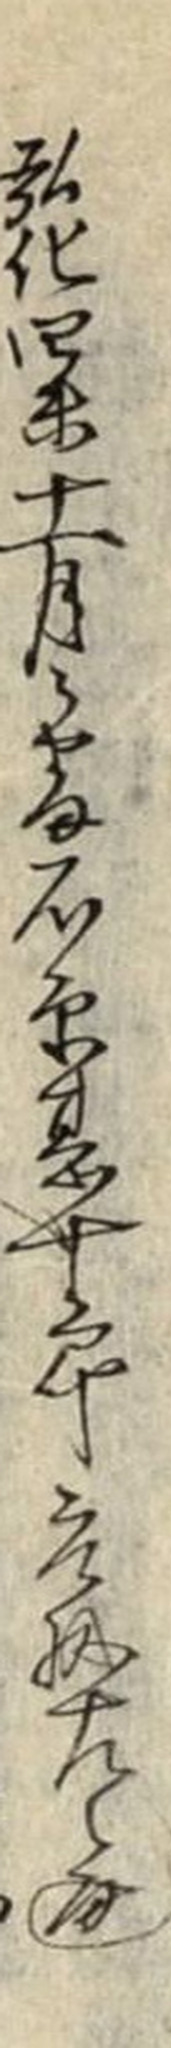弘化四未十一月々番石原甚十郎取扱左之通
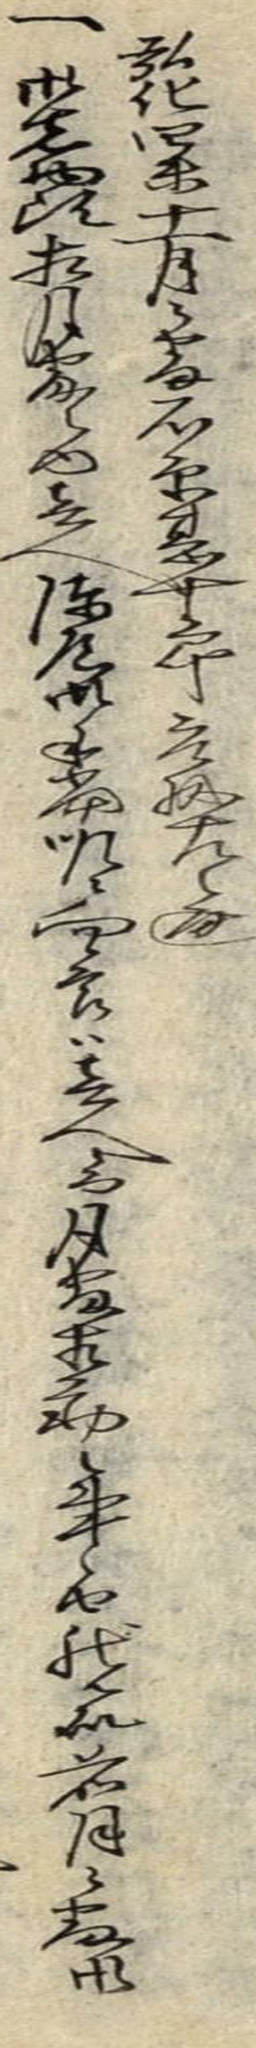一御先物頭相月番之内壱人陣屋御手当順々向候節は壱人に而月番相勤候事之由然る処前月々番御
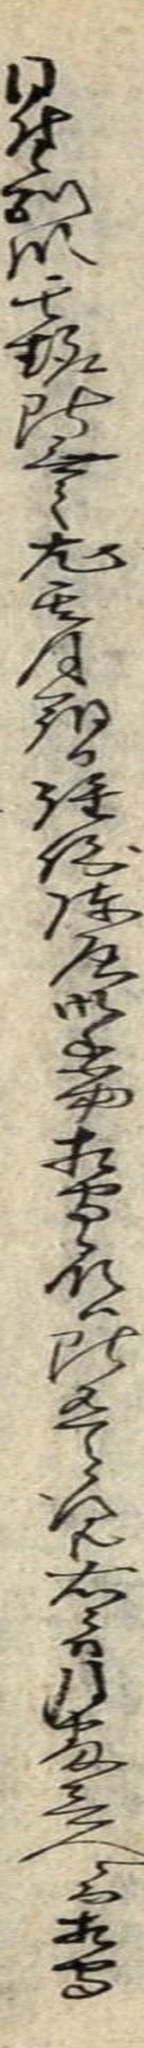目付別段其趣断無之尤其月朔日誰儀陣屋御手当相守候段は断有之候得共右に付月番壱人に而相守
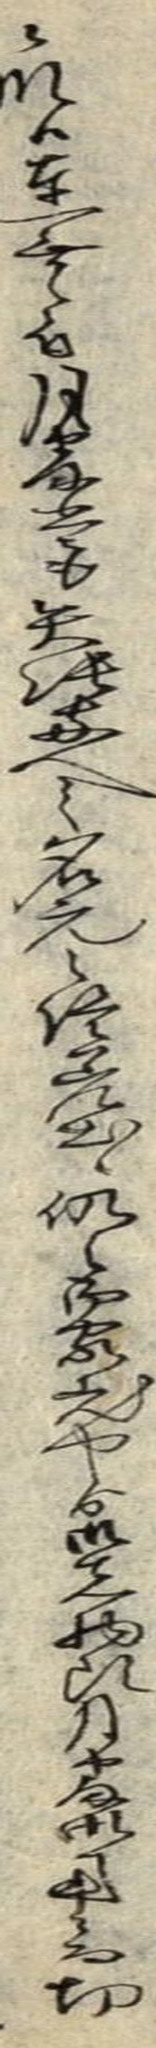候段は達無之候付月番書にも矢張両人之名元之侭差出候仍之御家老中ゟ御先物頭月番御用に而切
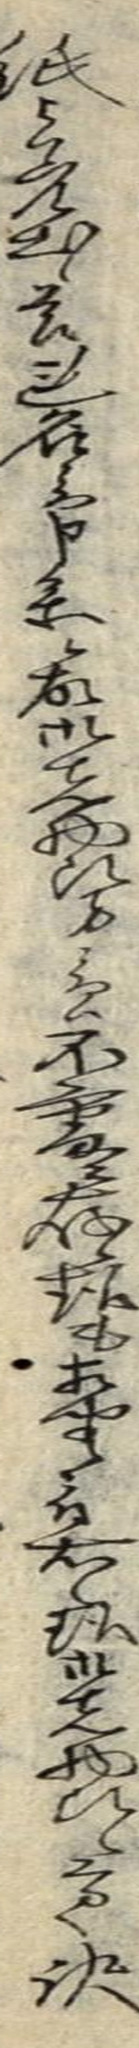紙被差出候節連名に而申参候故御先物頭方に而は不審に存候趣も相聞候に付右之趣御先物頭方へ訳
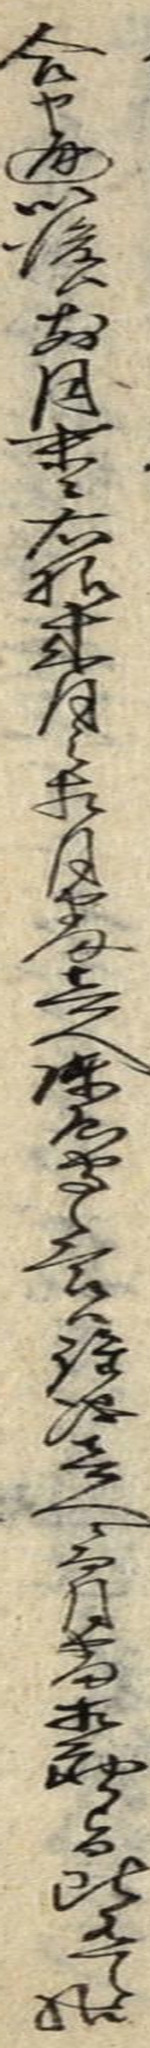合申通以後は前月末に右様来月之相月番壱人陣屋守之節は誰儀壱人に而月番相勤候旨断有之候様
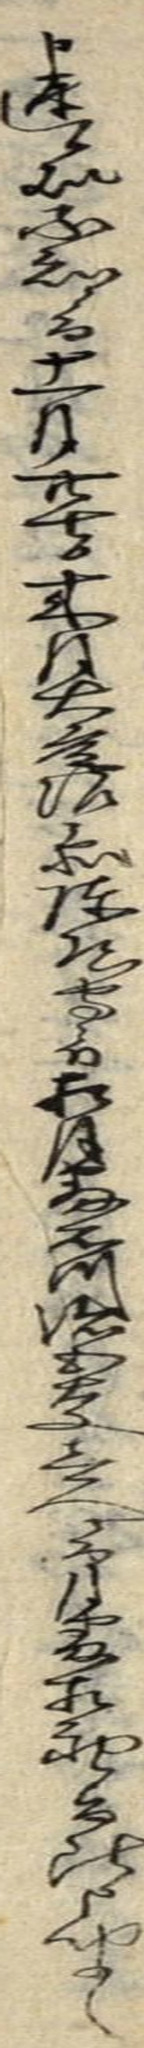申達候処承知に而十一月廿七日来月大藤治兵衛陣屋守に付相月番石川弥五太夫壱人に而月番相勤候旨断申聞候
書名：蒐輯之部
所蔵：福井県文書館 Fukui Prefectural Archives
